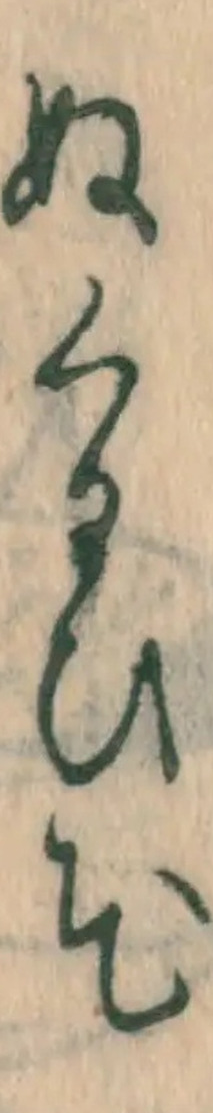ぬくるひ花
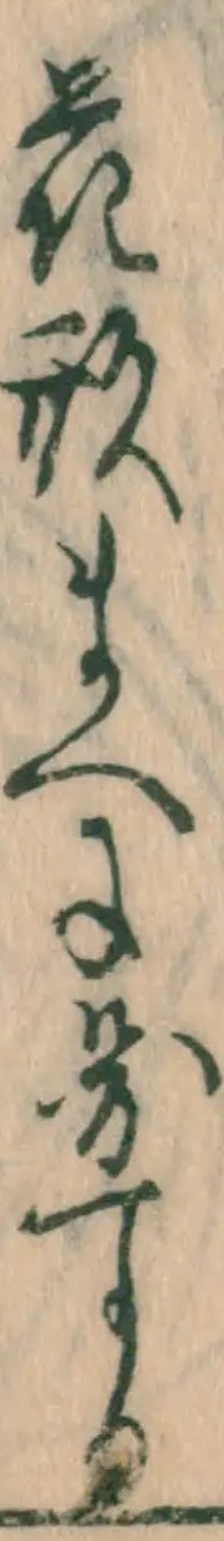花形まへに図する
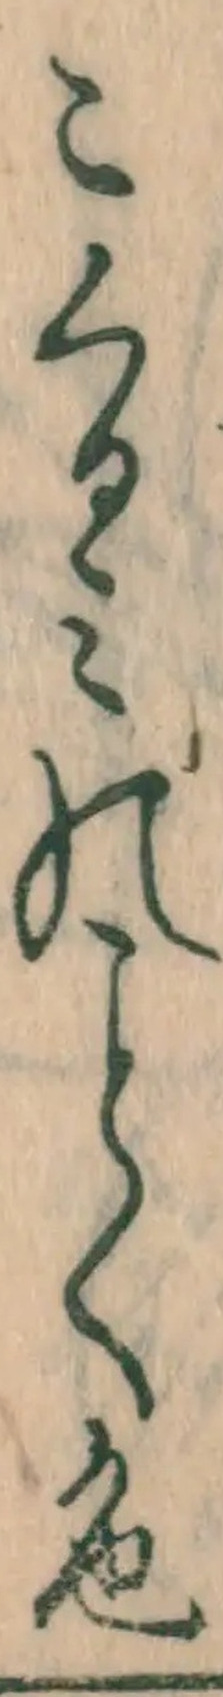こくるみのことく色
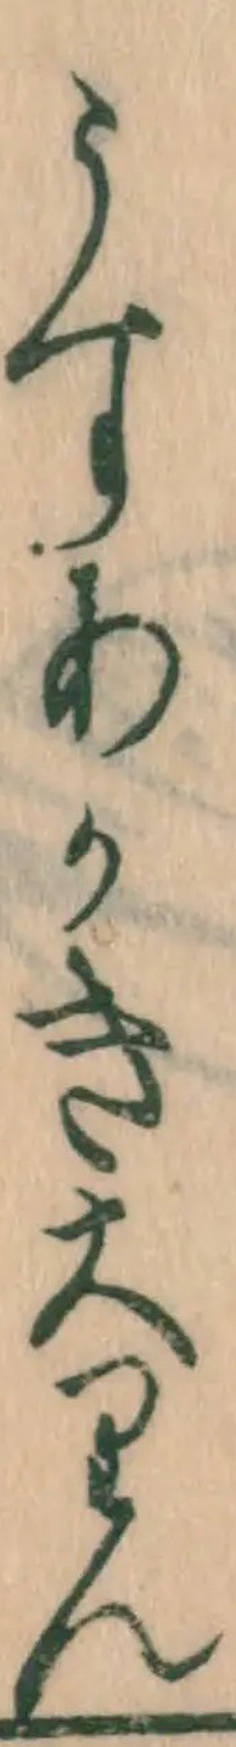うすあかき大りん
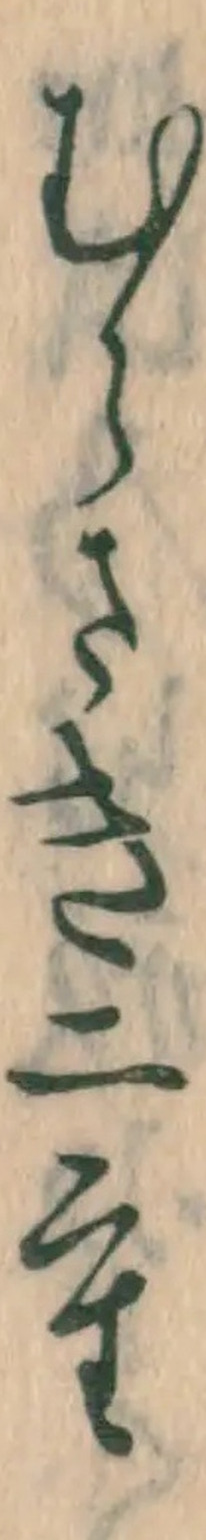むらさき二重
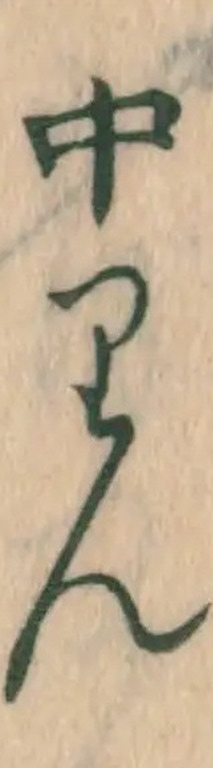中りん
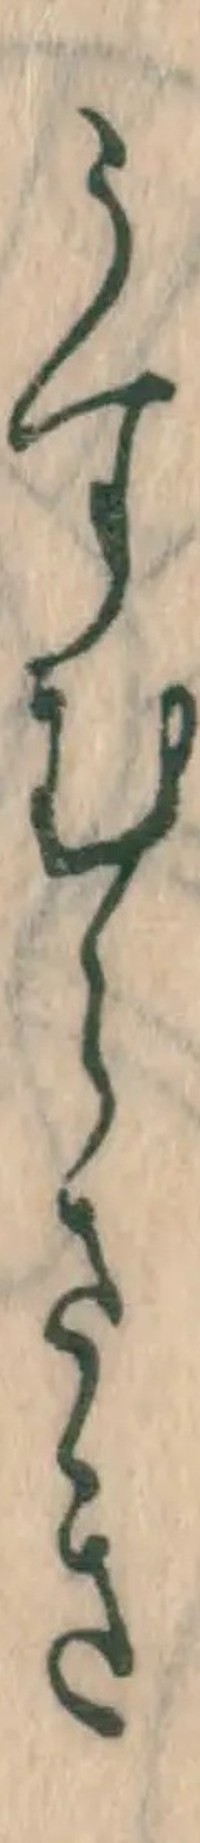うすむらさき
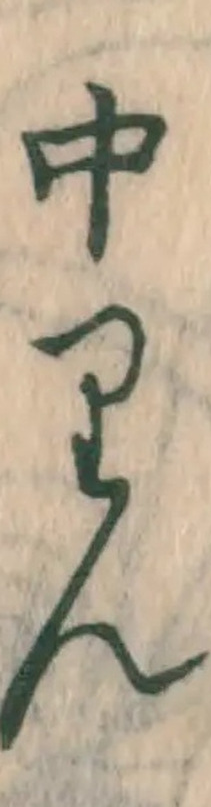中りん
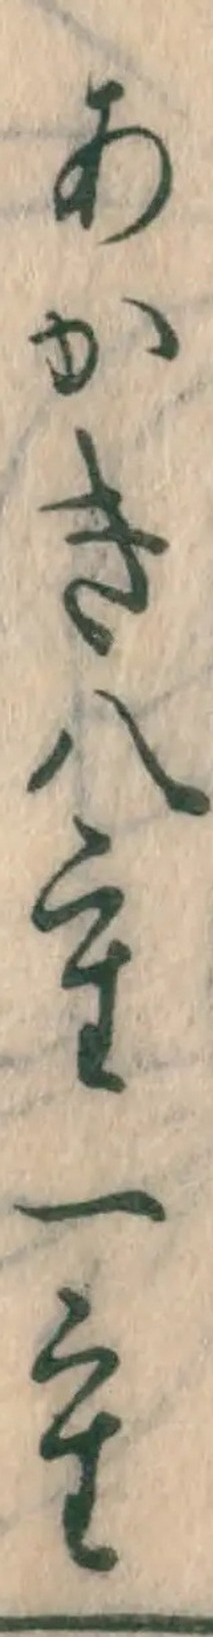あかき八重一重
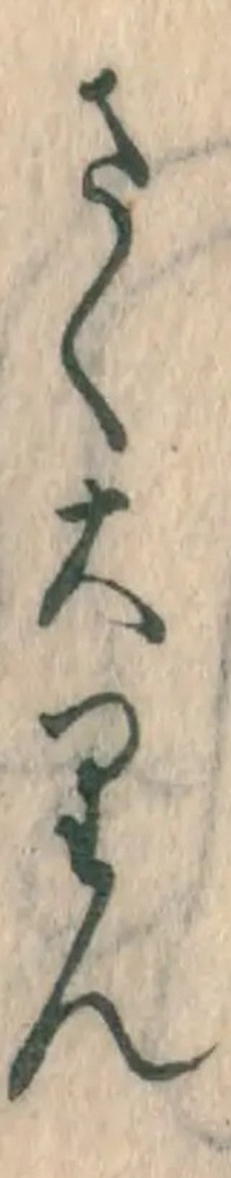さく大りん

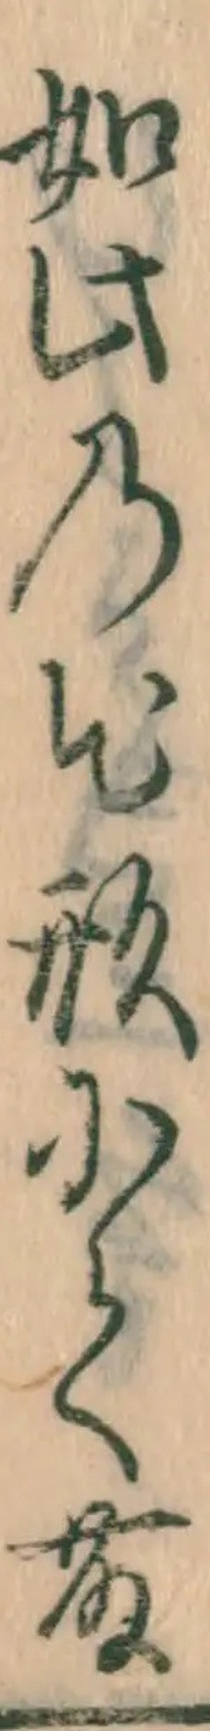如此の花形にて藤
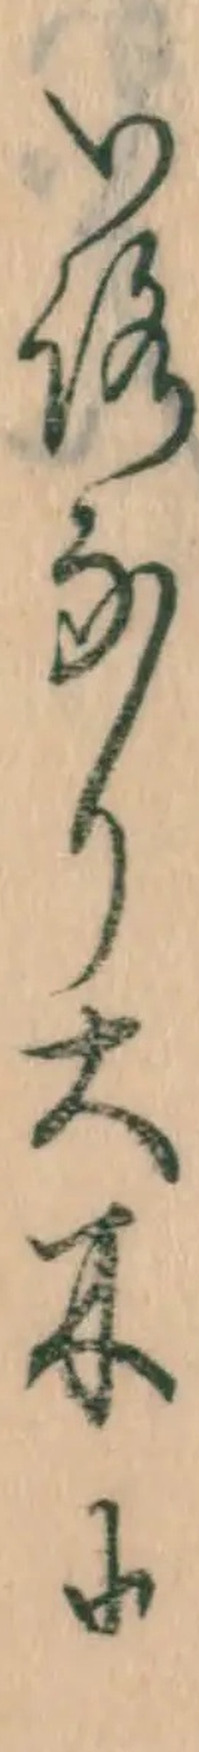いろなり大木に
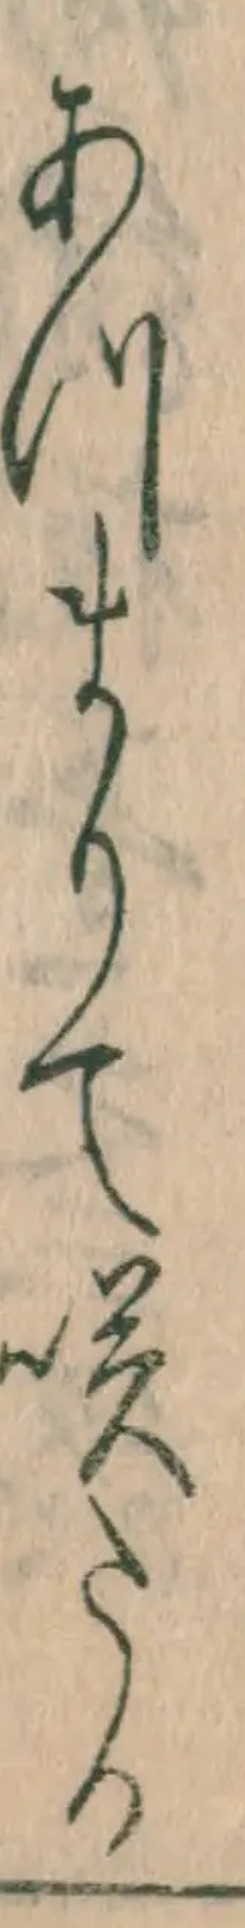あつまりて咲たる
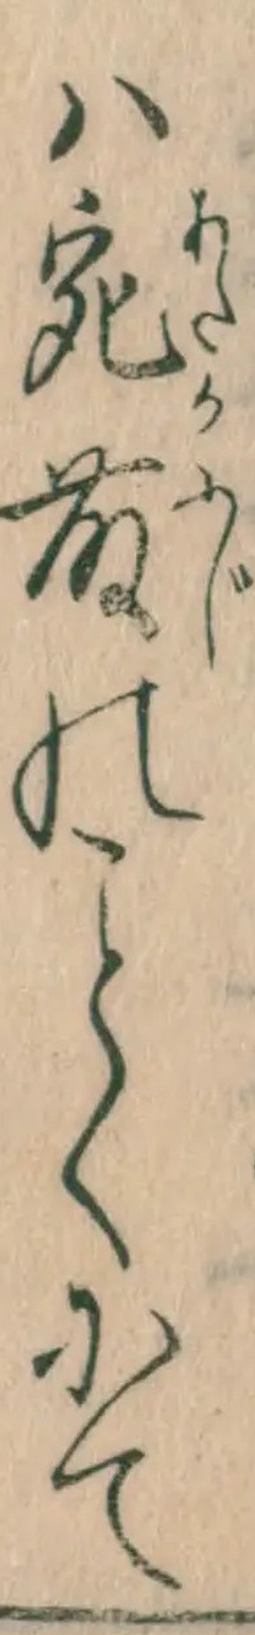は宛藤のことくにて
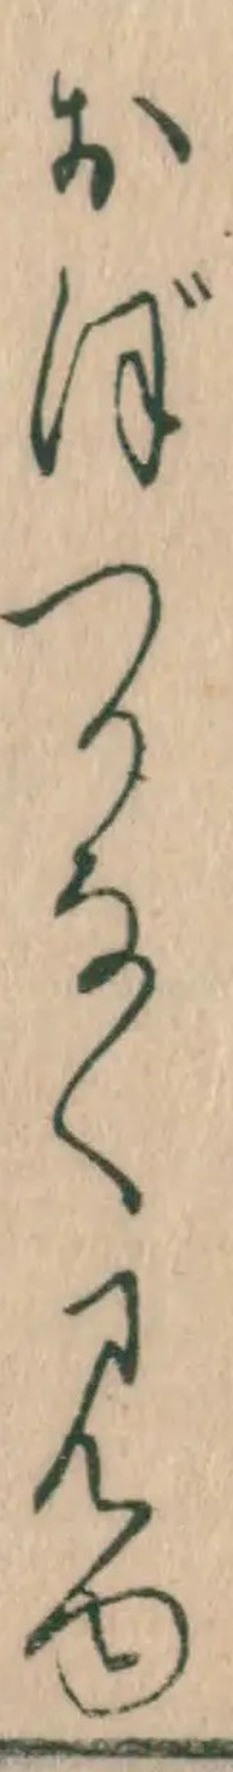おぼつかなく見ゆ
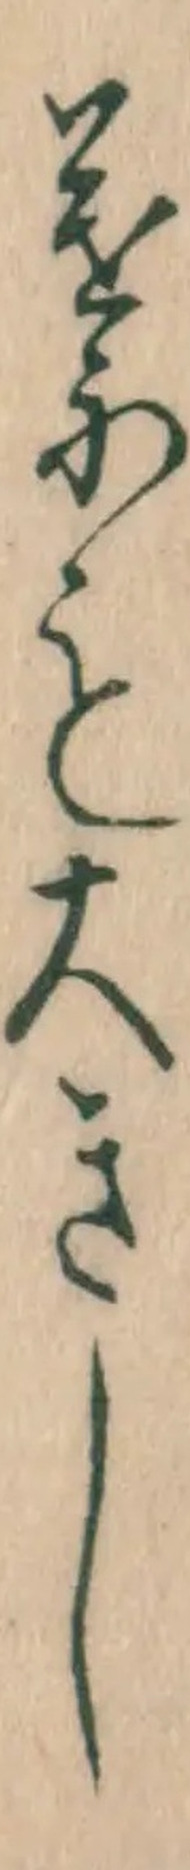葉も大きし
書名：錦繍枕 5巻. [3]
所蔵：国立国会図書館 National Diet Library, JAPAN
